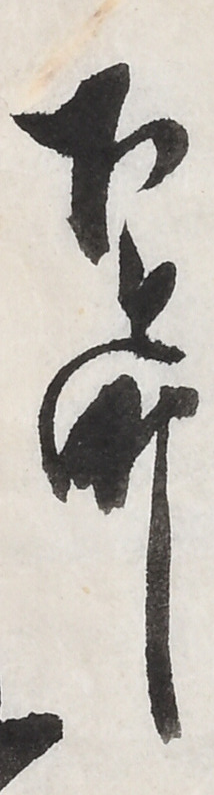下も町

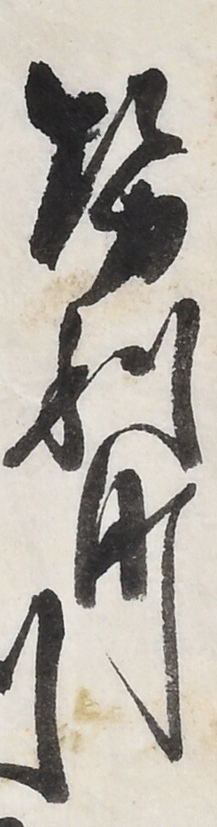勢利町
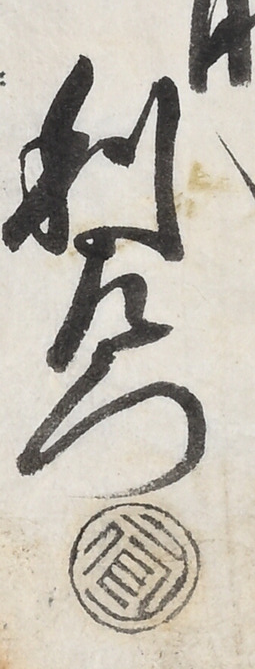利左衛門㊞
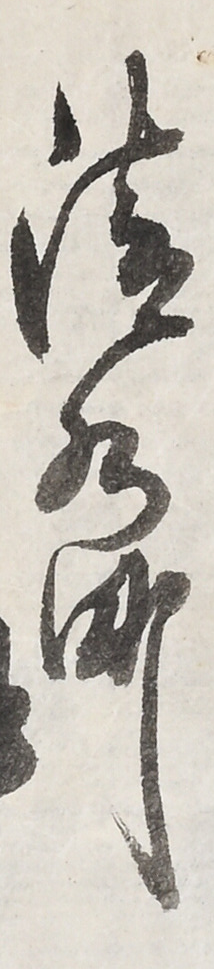清水町
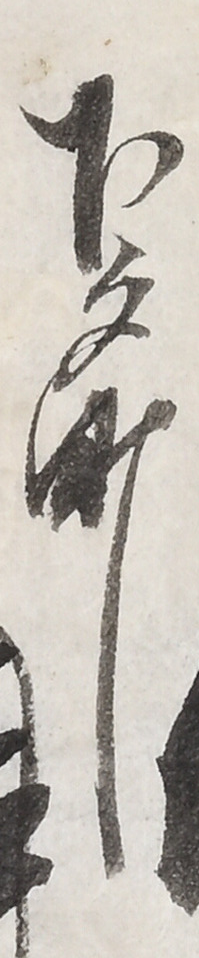下タ町
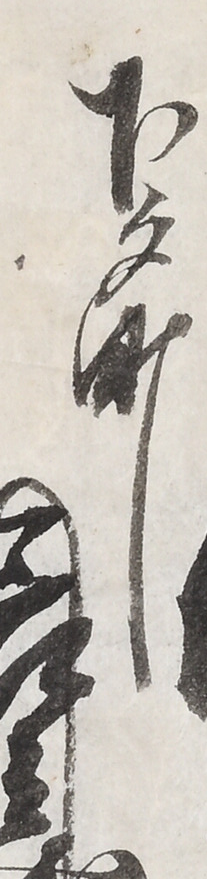下タ町
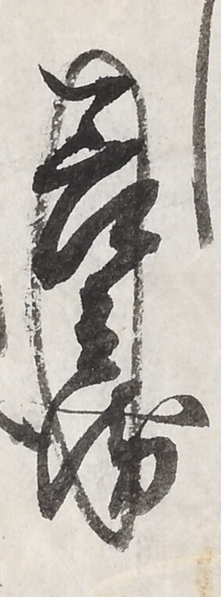善兵衛
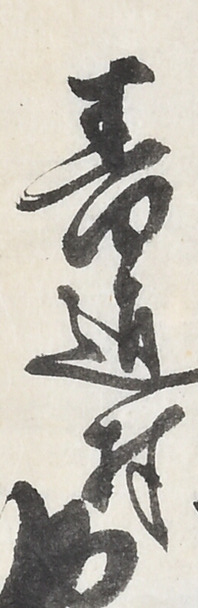春近村
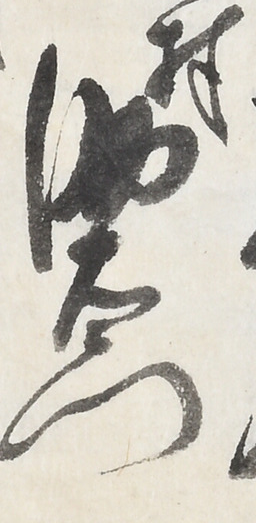助右衛門
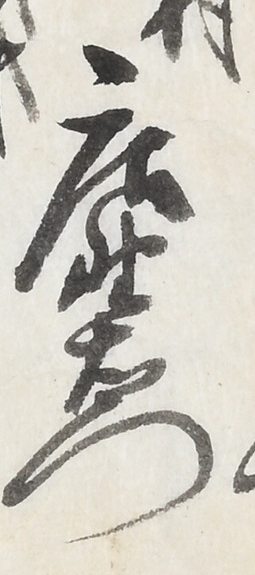庄野右衛門

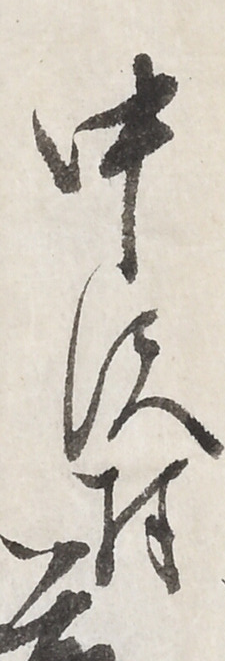中沢村
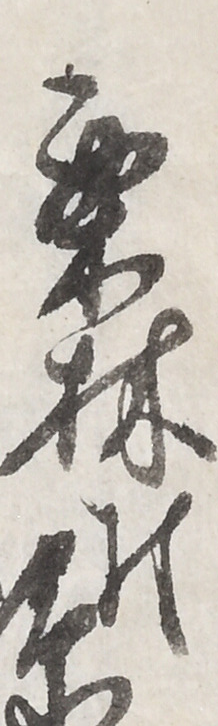栗林村
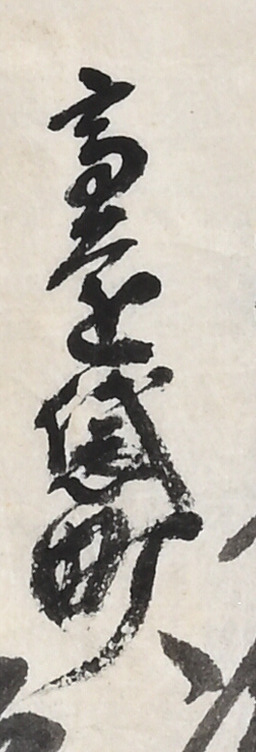高遠袋町
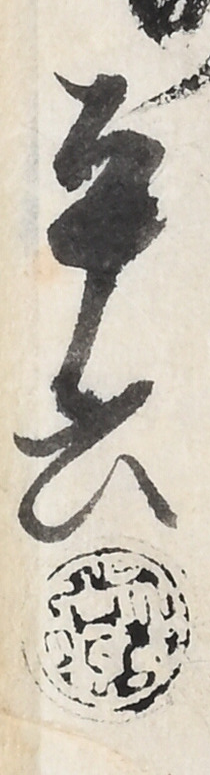平六㊞
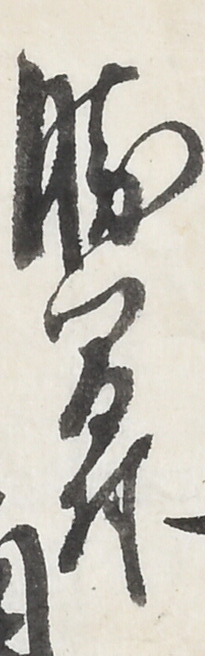勝間村
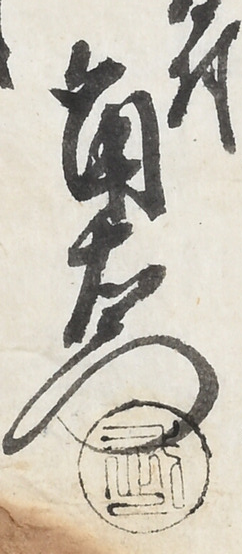染右衛門
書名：高遠御領分鍛冶相定帳
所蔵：伊那市立高遠町図書館・合同会社AMANE
